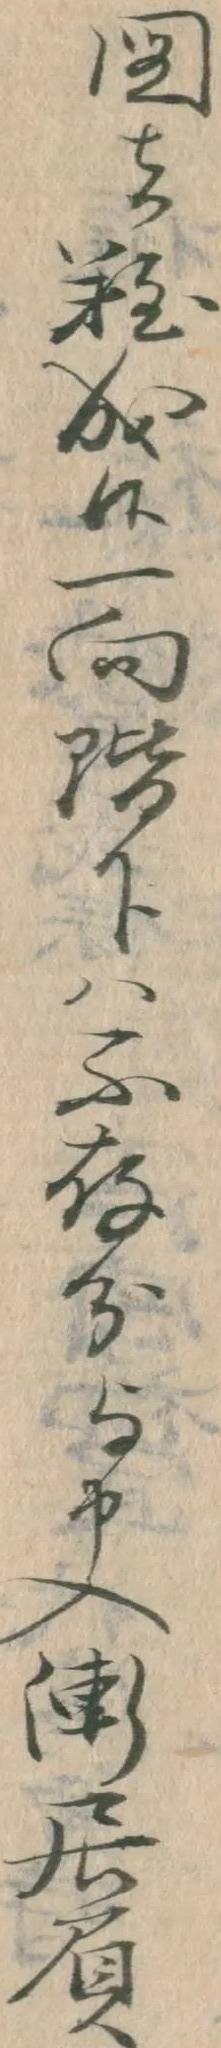図者難成候一向階下ハ不存分与申入漸居負
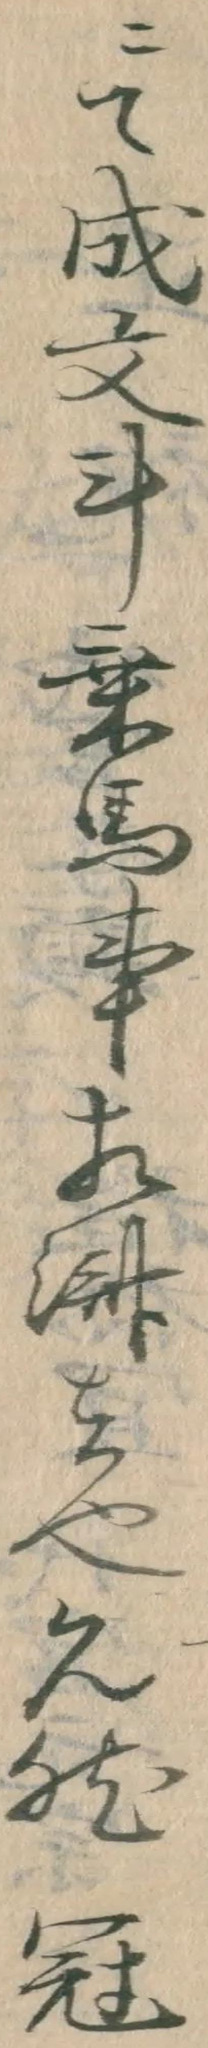ニて成文計乗馬事相済者也乍然冠
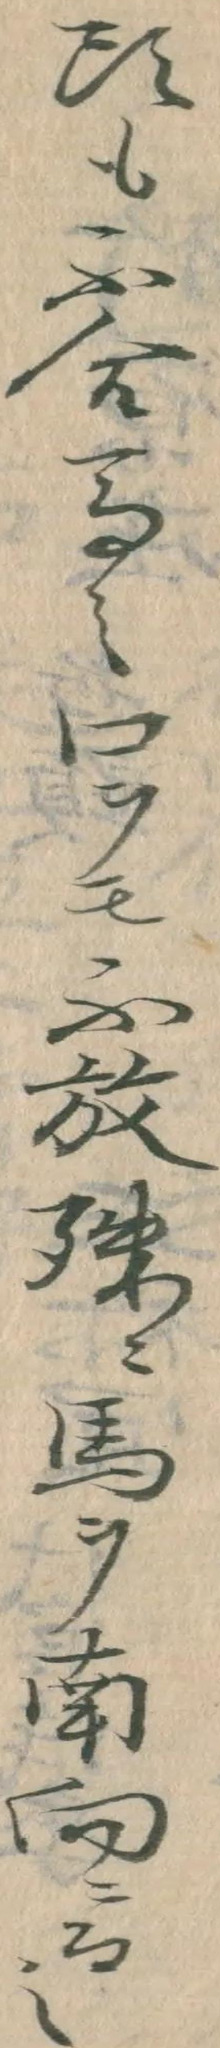頭も不合馬之口ヲモ不放殊ニ馬ヲ南向ニ而之
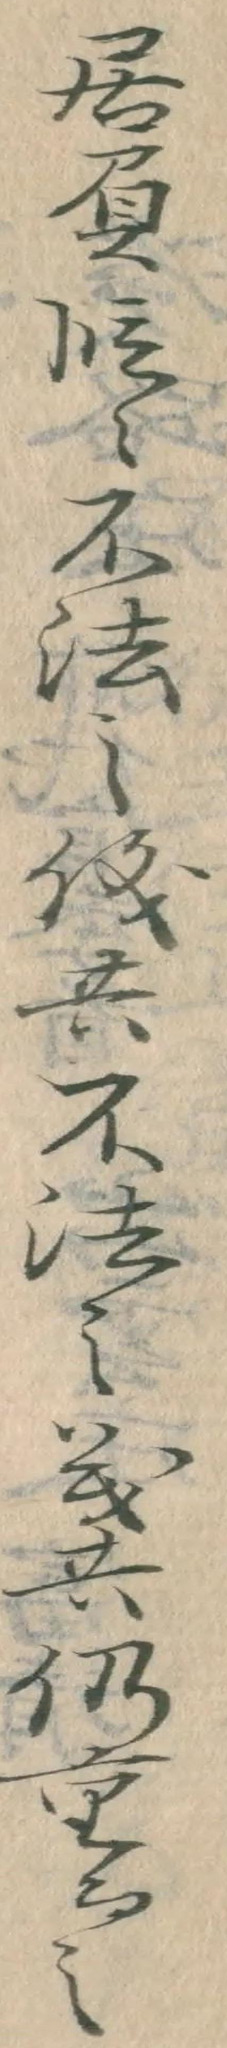居負段々不法之儀共不法之義共仍重而之
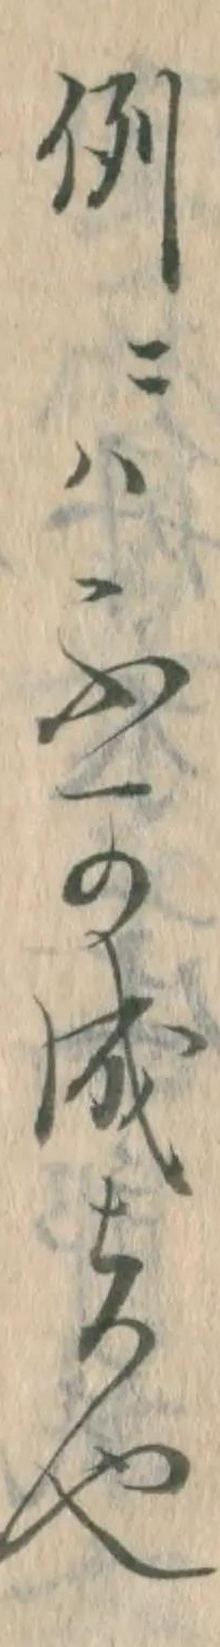例ニハ不可成者也
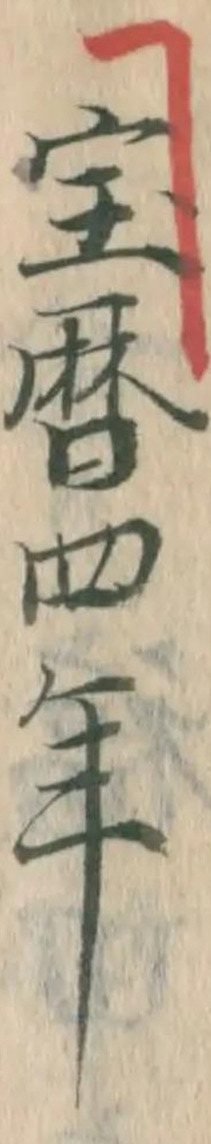宝暦四年

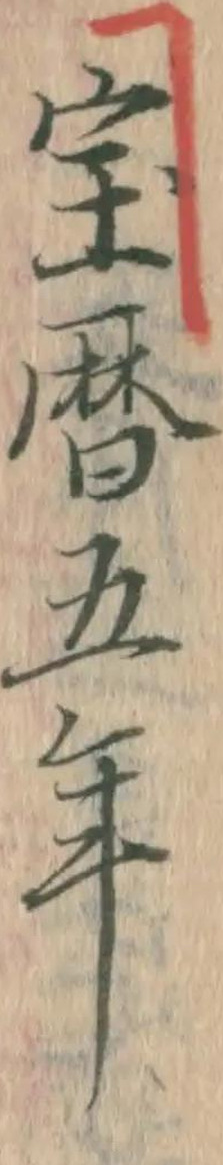宝暦五年
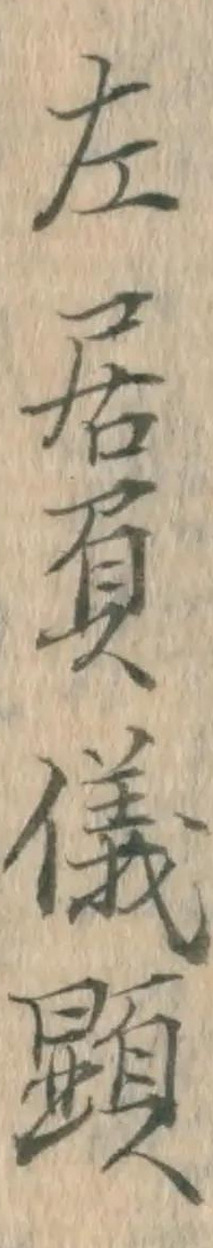左居負儀顕
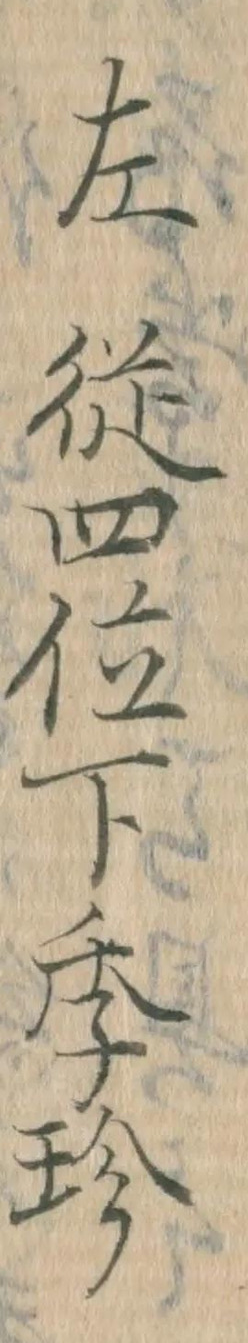左従四位下季珍
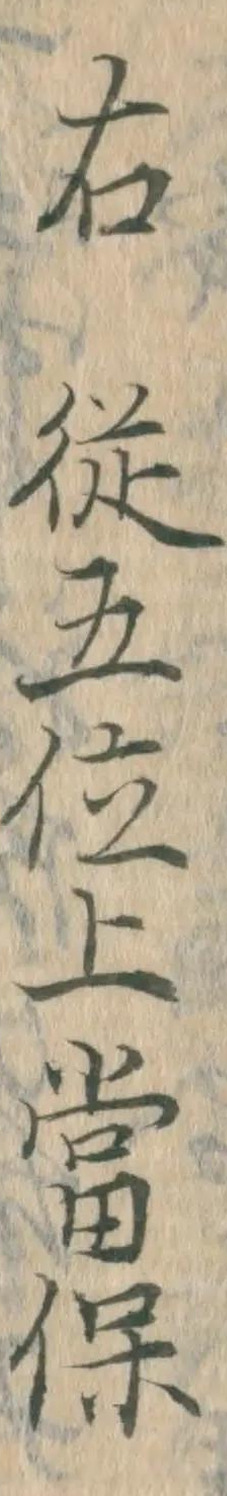右従五位上当保
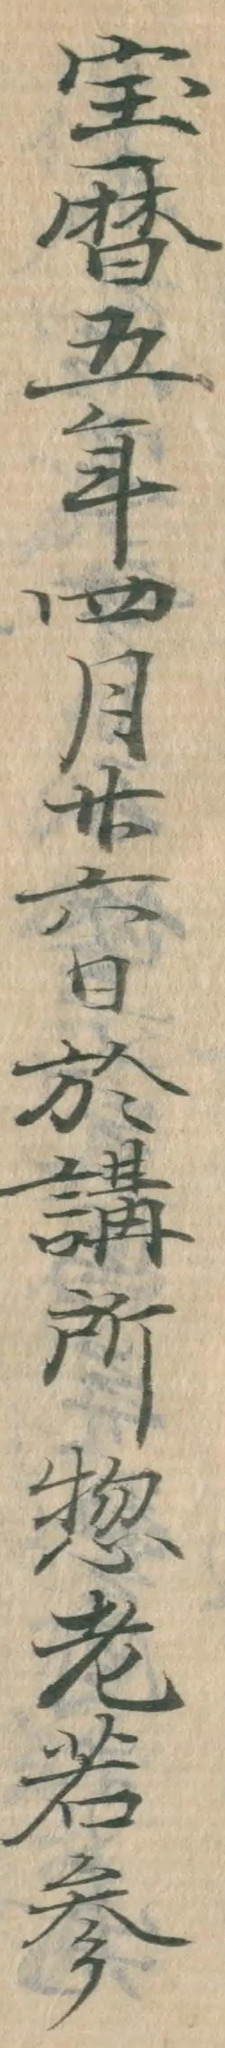宝暦五年四月廿六日於講所惣老若参
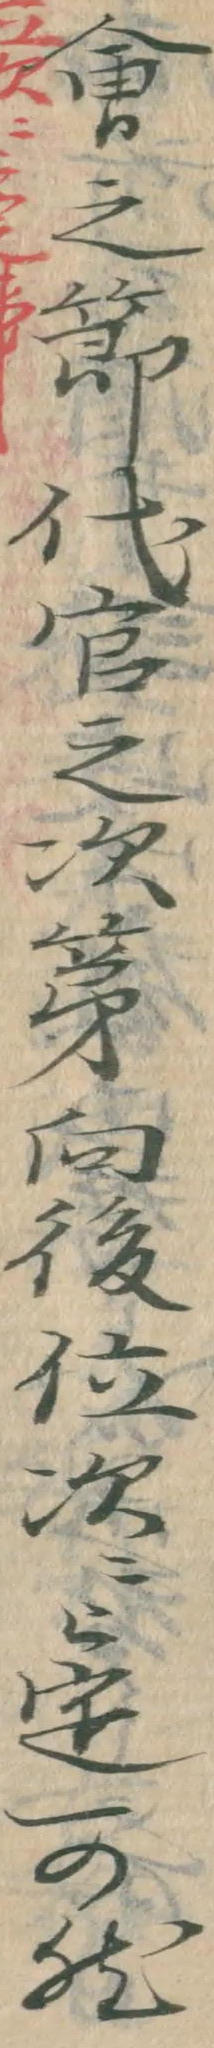会之節代官之次第向後位次ニ被定可然
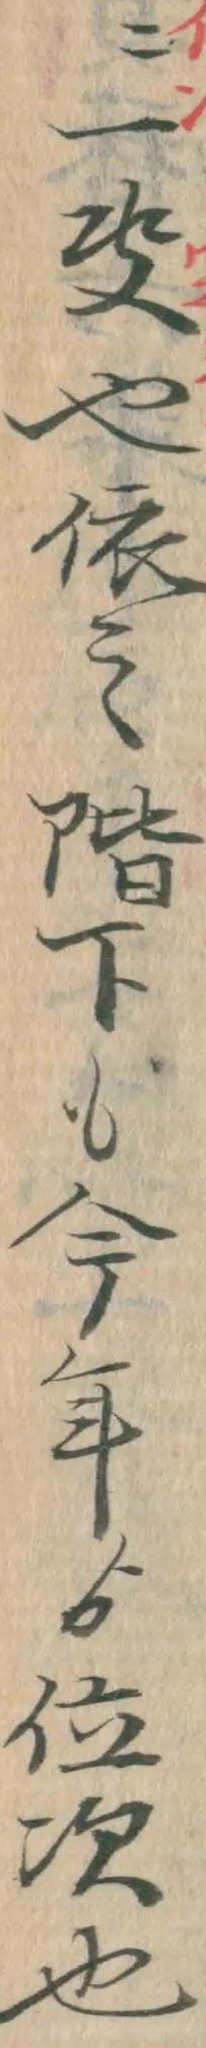一決也依之階下も今年ゟ位次也

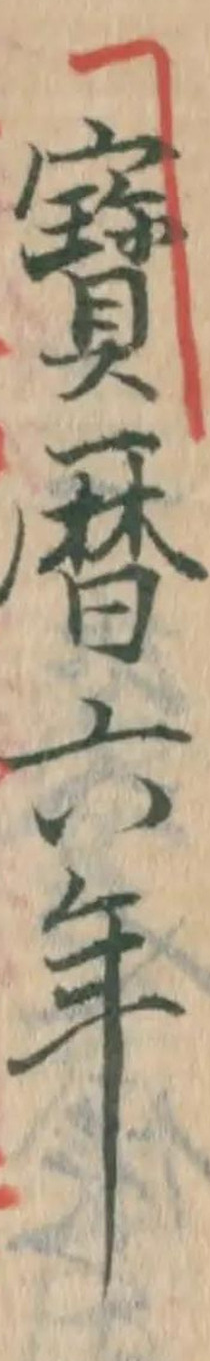宝暦六年
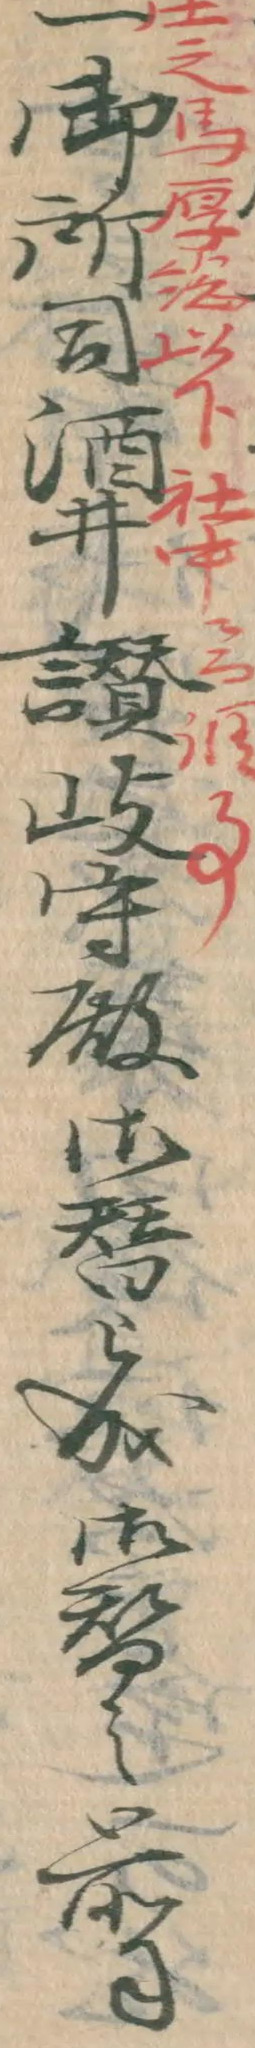一御所司酒井讃岐守殿御替被成御替之御所司
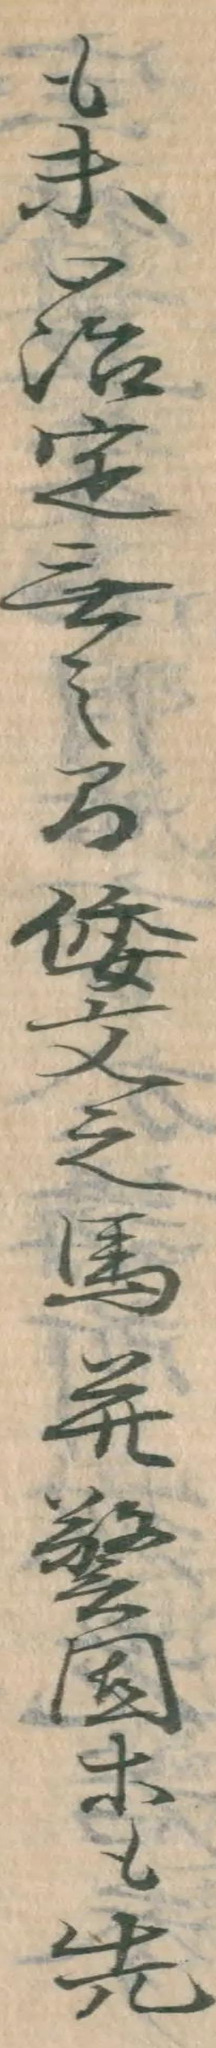も未御治定無之間倭文之馬并警固等も先
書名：賀茂社記録. 第10冊
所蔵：国立国会図書館 National Diet Library, JAPAN
